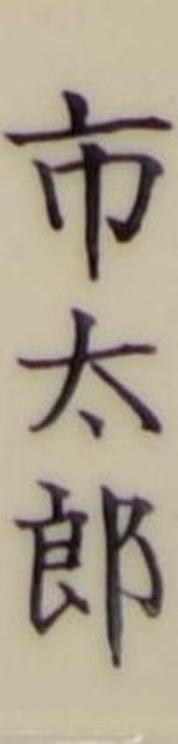市太郎
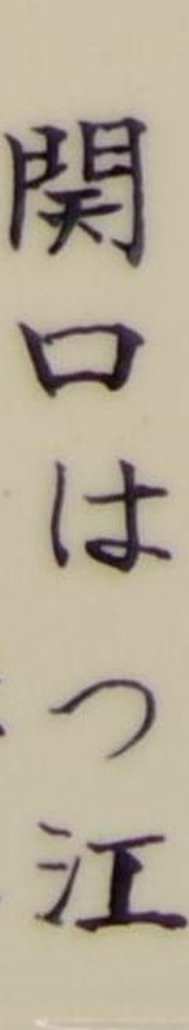関口はつ江

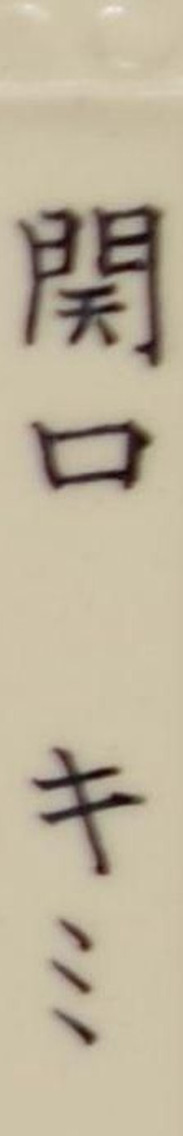関口キミ
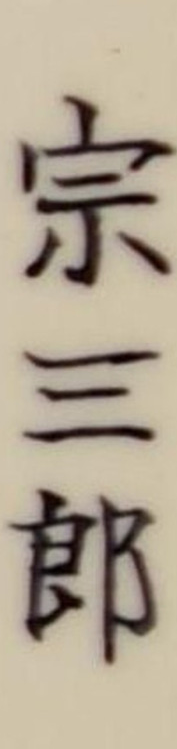宗三郎
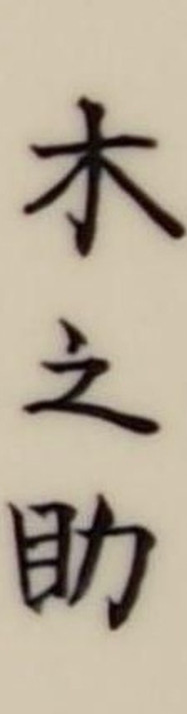木之助
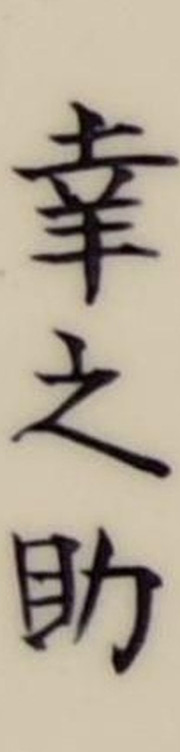幸之助
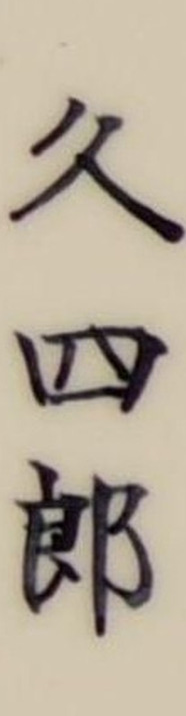久四郎
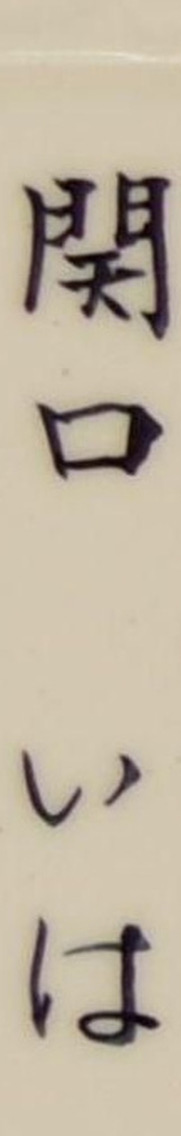関口いは
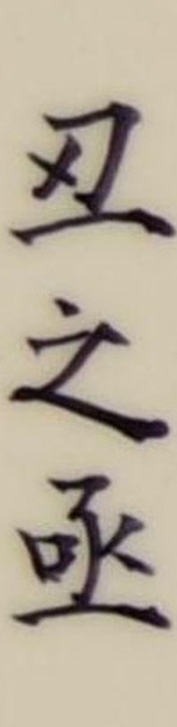丑之丞
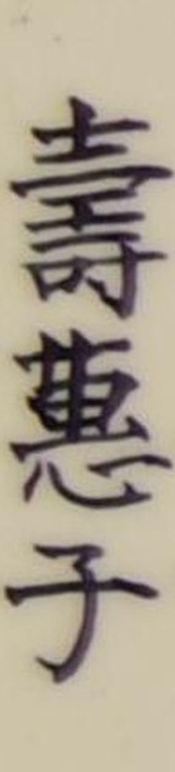壽恵子

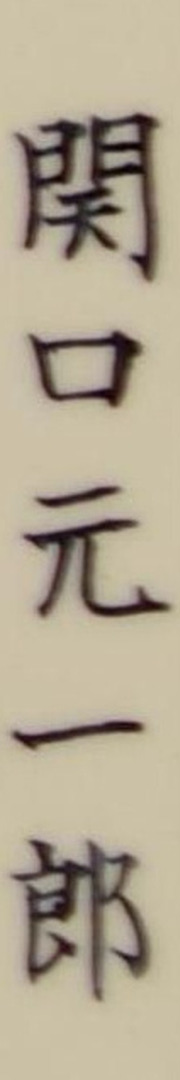関口元一郎
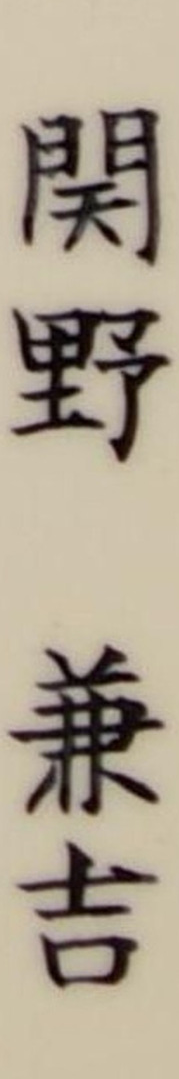関野兼吉
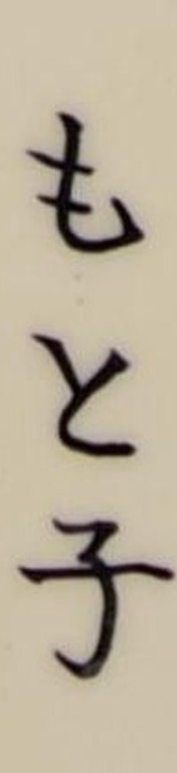もと子
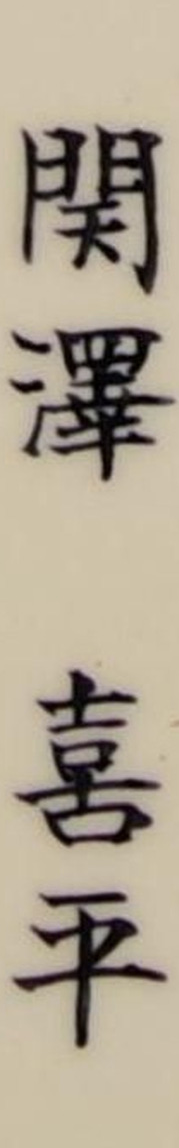関澤喜平
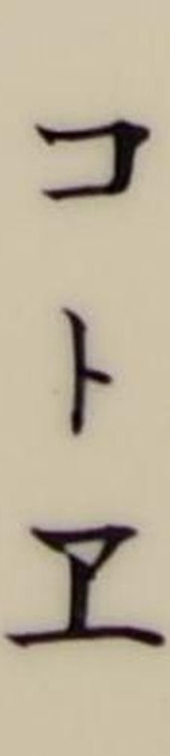コトヱ
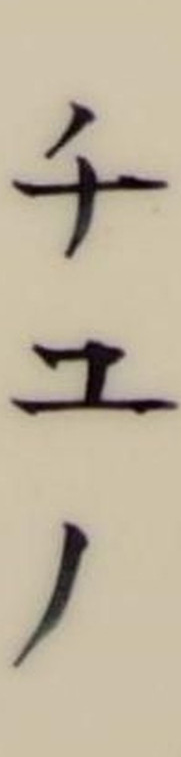チユノ
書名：A~D
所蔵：koyasan kongobuji
